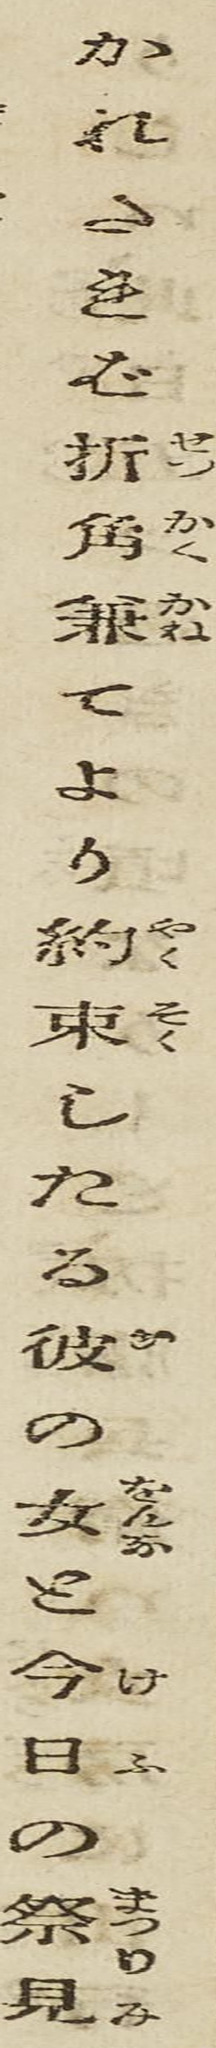かれたれば折角兼てより約束したる彼の女と今日の祭見
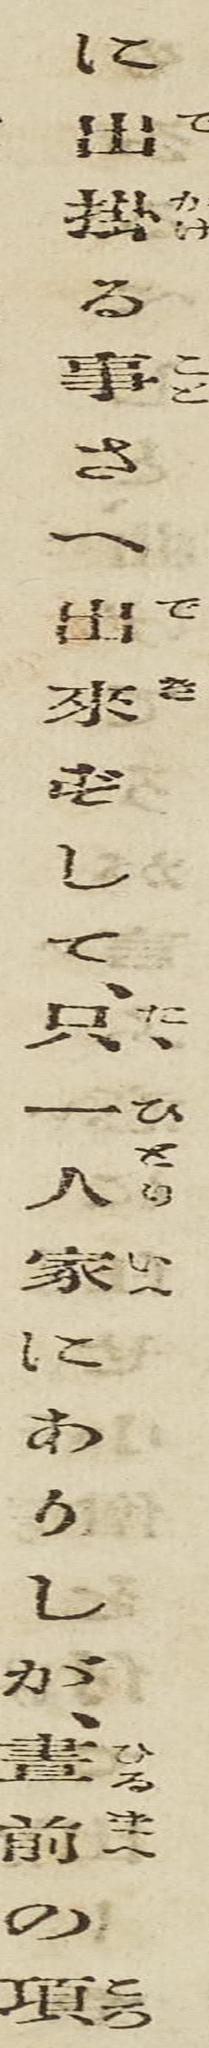に出掛る事さへ出来ずして、只一人家にありしが、昼前の頃
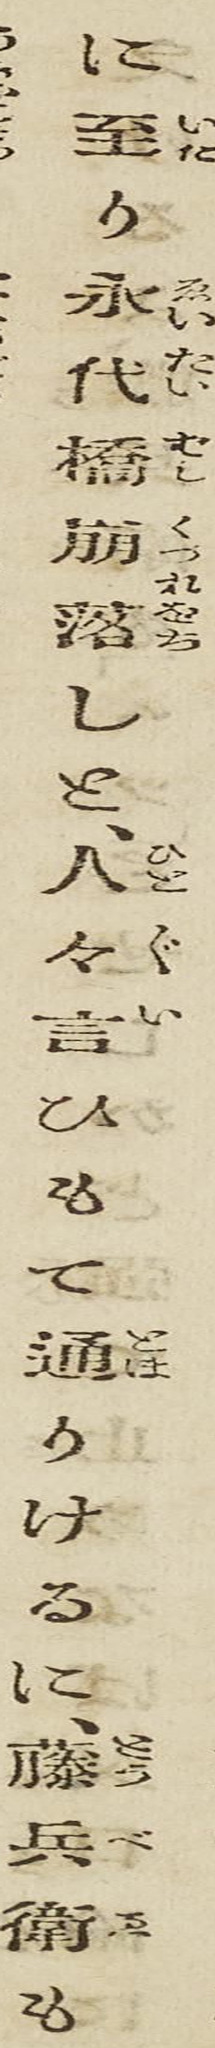に、至り永代橋崩落しと、人々言ひもて通りけるに、藤兵衛も
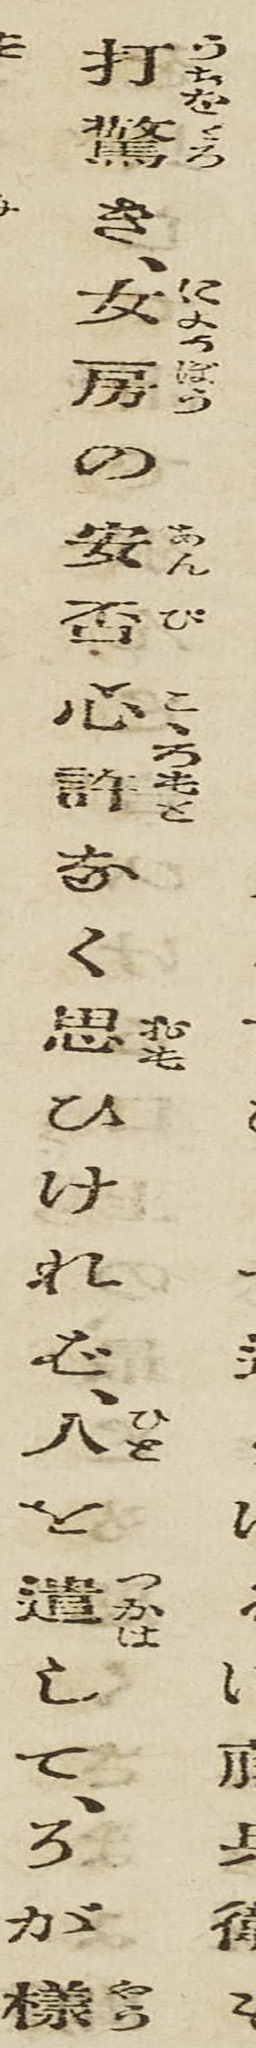打驚き、女房の安否心許なく思ひければ、人を遣して、そが様
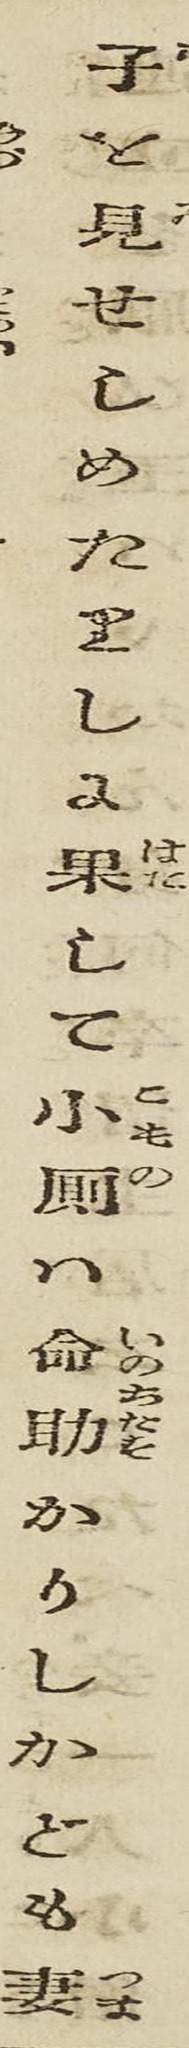子を見せしめたりしに果して小厠は命助かりしかとも妻
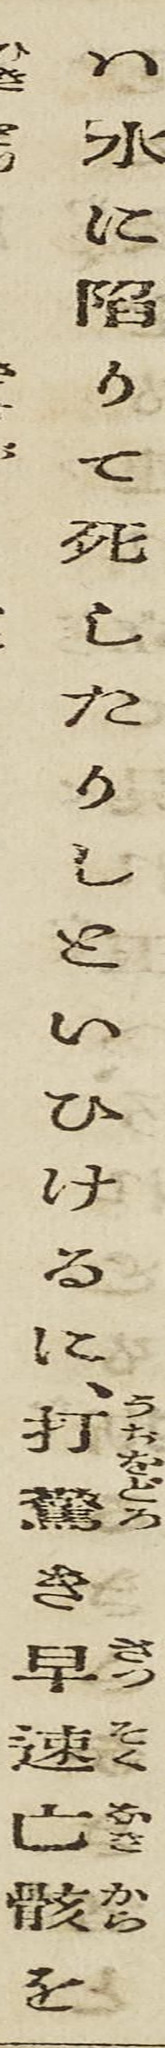は水に陥りて死したりしといひけるに、打驚き早速亡骸を
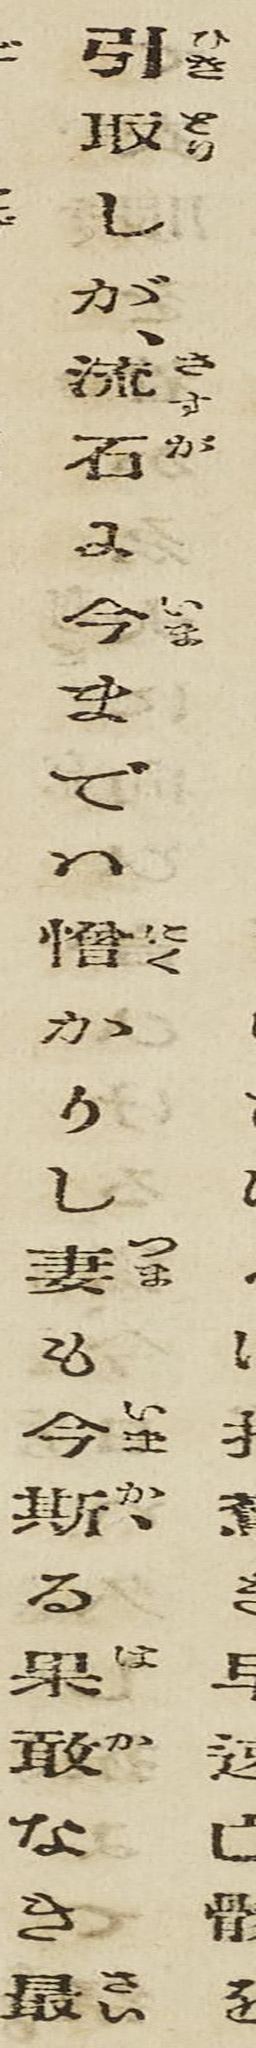引取しが、流石に今までは憎かりし妻も今斯る果敢なき最
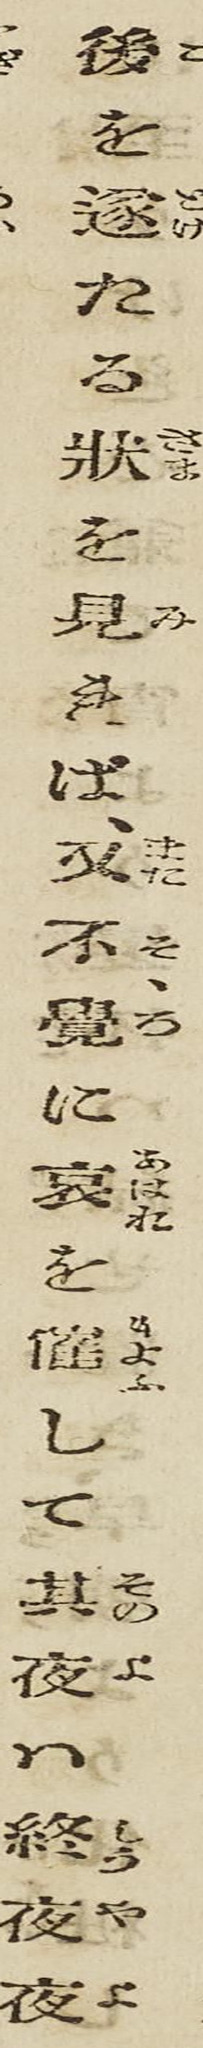後を遂たる状を見れば、又不覚に哀を催して其夜は終夜夜
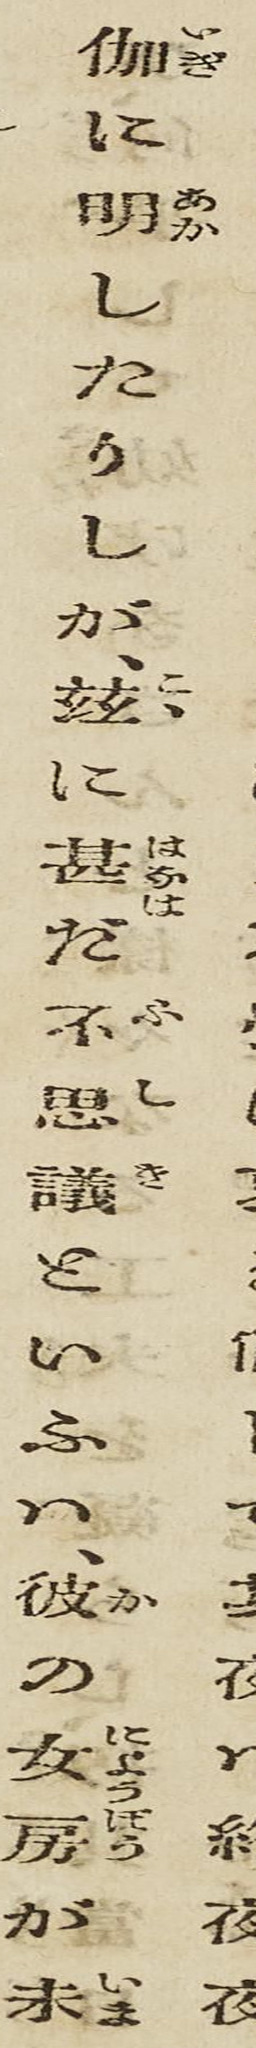伽に明したりしが、茲に甚だ不思議といふは、彼の女房が未
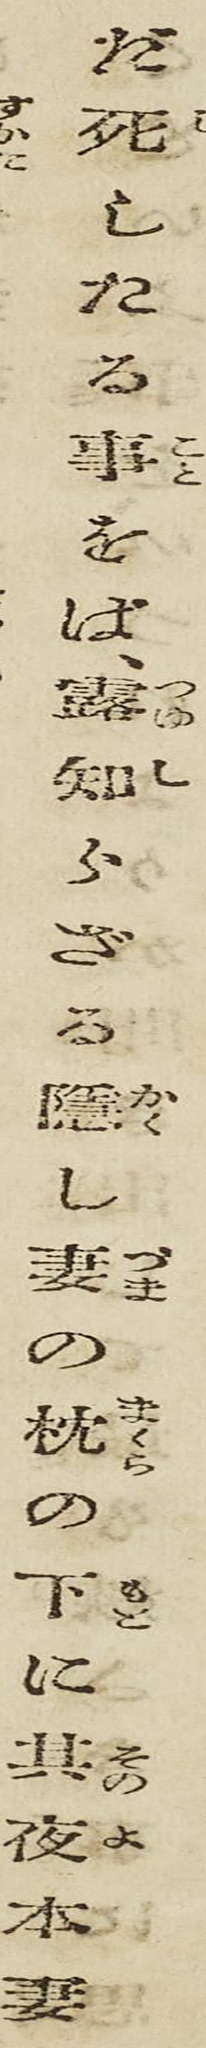だ死したる事をば、露知らざる隠し妻の枕の下に其夜本妻
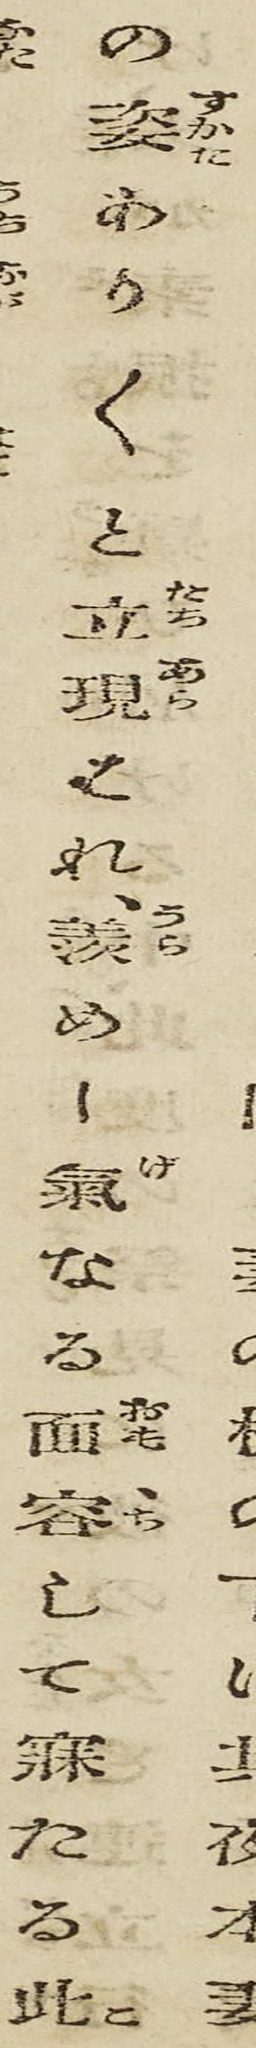の姿あり〳〵と立現はれ、羨めし気なる面容して寐たる此
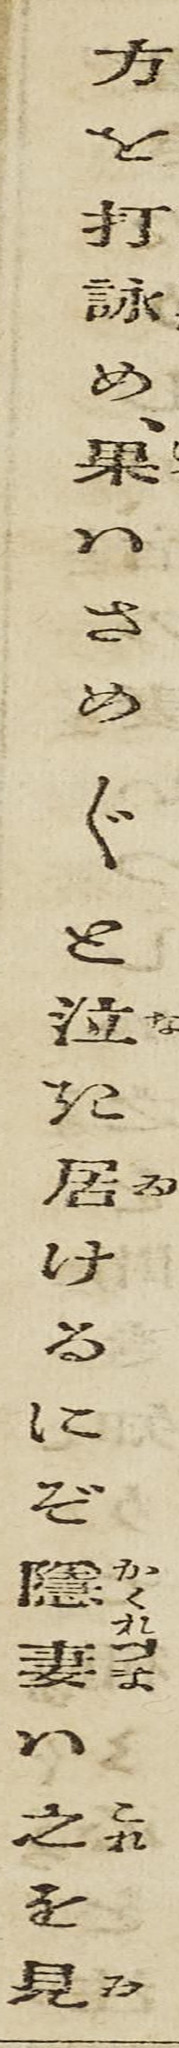方を打詠め、果はさめ〴〵と泣き居けるにぞ隠妻は之を見
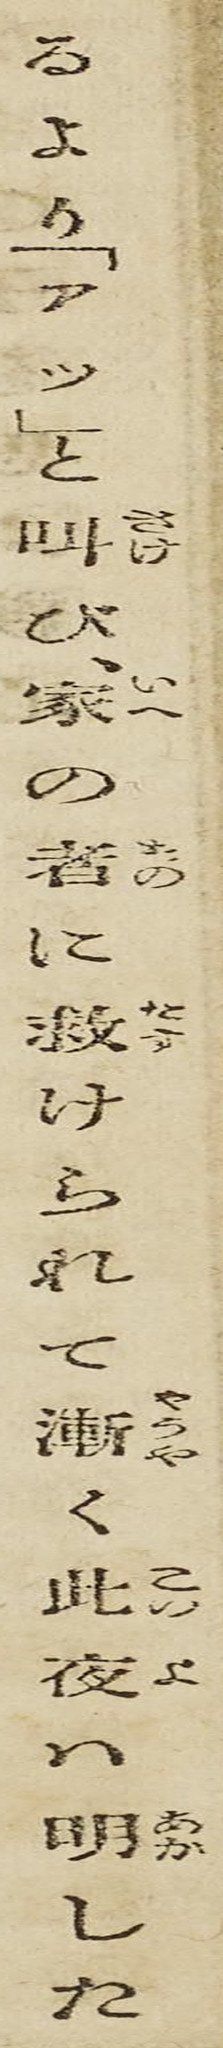るより「アツ」と叫び、家の者に救けられて漸く此夜は明した
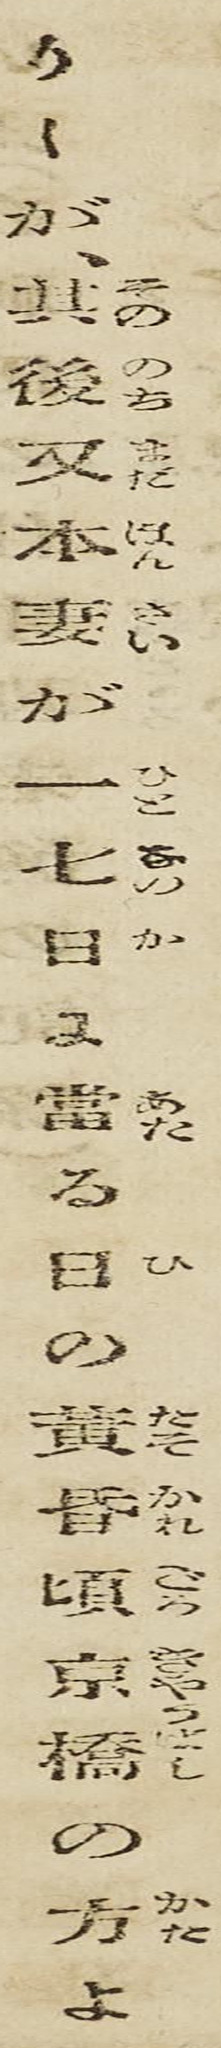りしが、其後又本妻が一七日に当る日の黄昏頃京橋の方よ
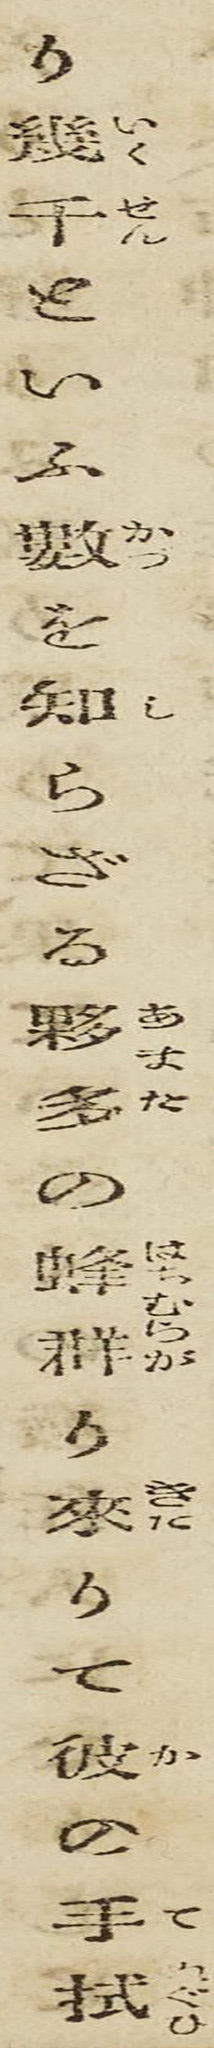り幾千といふ数を知らざる夥多の蜂群り来りて彼の手拭
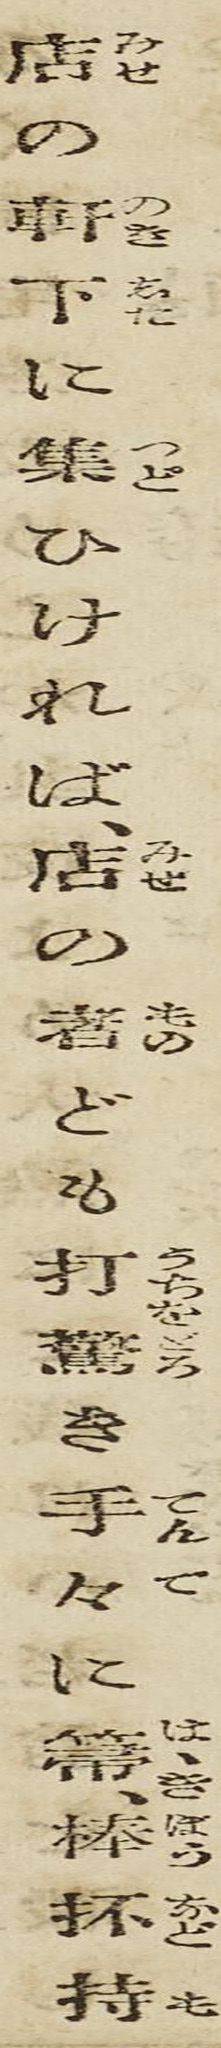店の軒下に集ひければ、店の者ども打驚き手々に箒、棒抔持
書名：永代惨話　文化の夢　全
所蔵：東京大学地震研究所図書室 Earthquake Research Institute Library, The University of Tokyo, JAPAN
